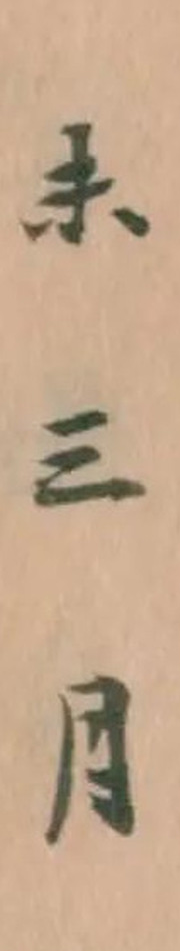未三月
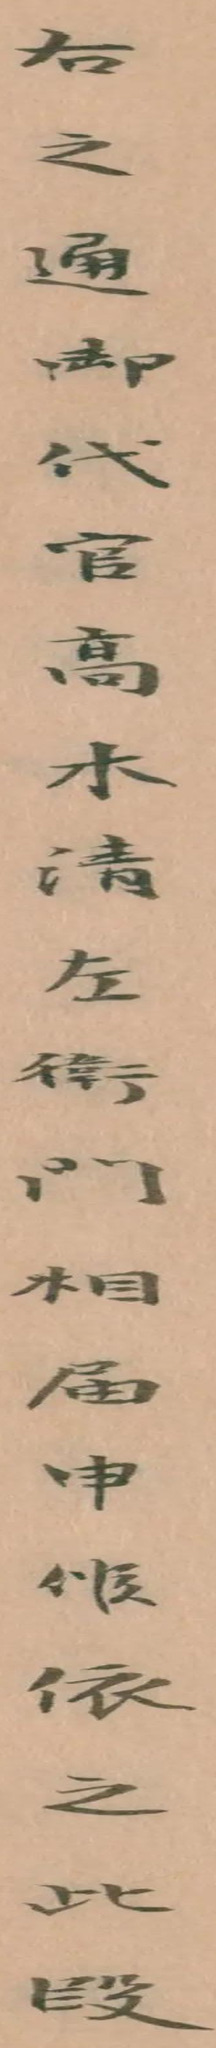右之通御代官高木清左衛門相届申候依之此段
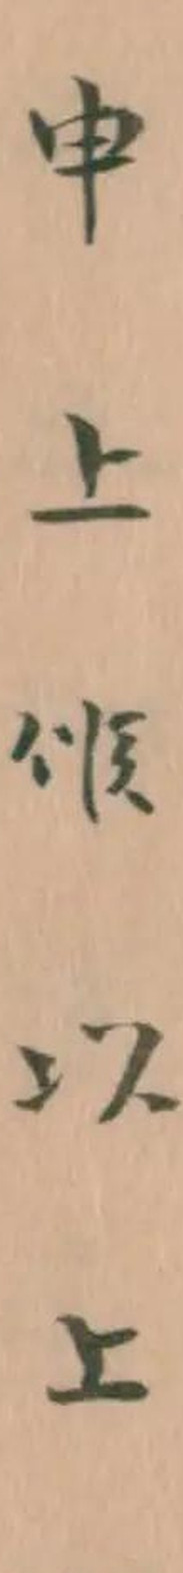申上候以上
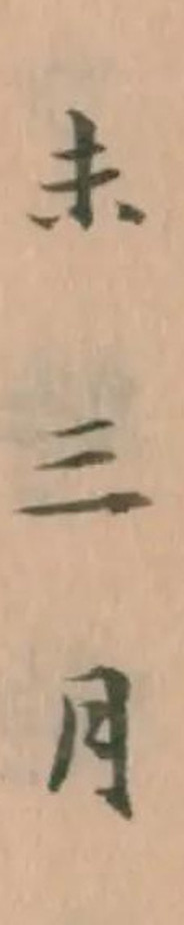未三月
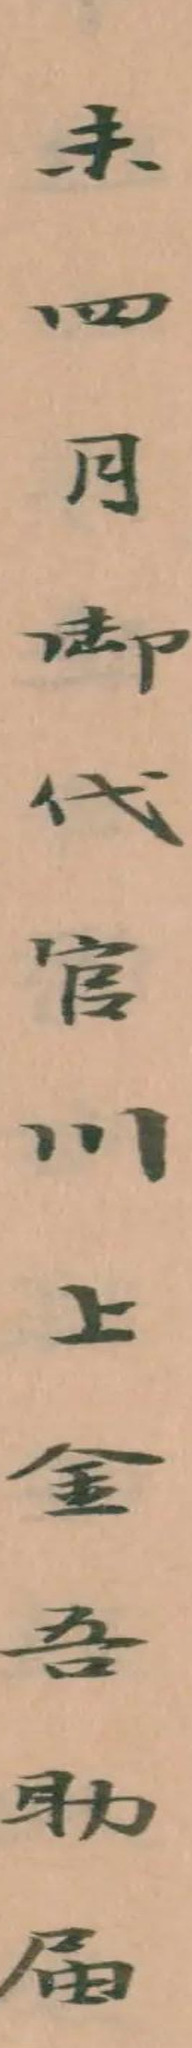未四月御代官川上金吾助届
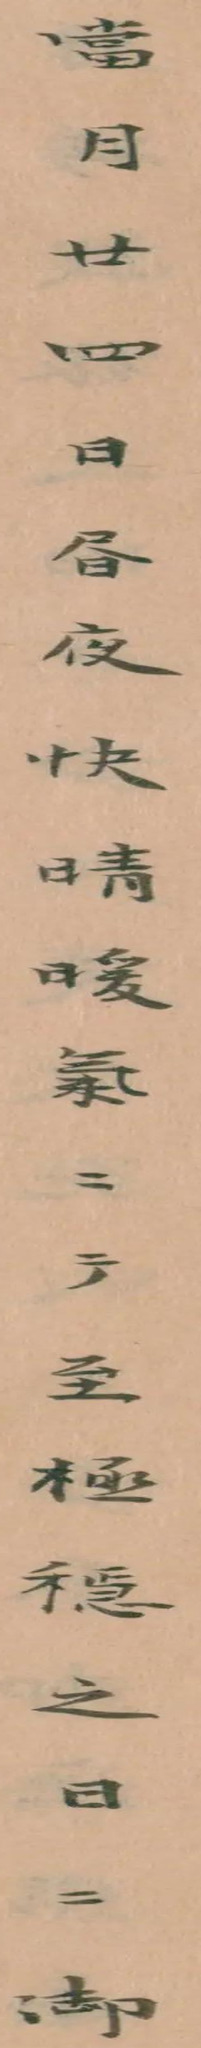当月廿四日昼夜快晴暖気ニテ至極穏之日ニ御
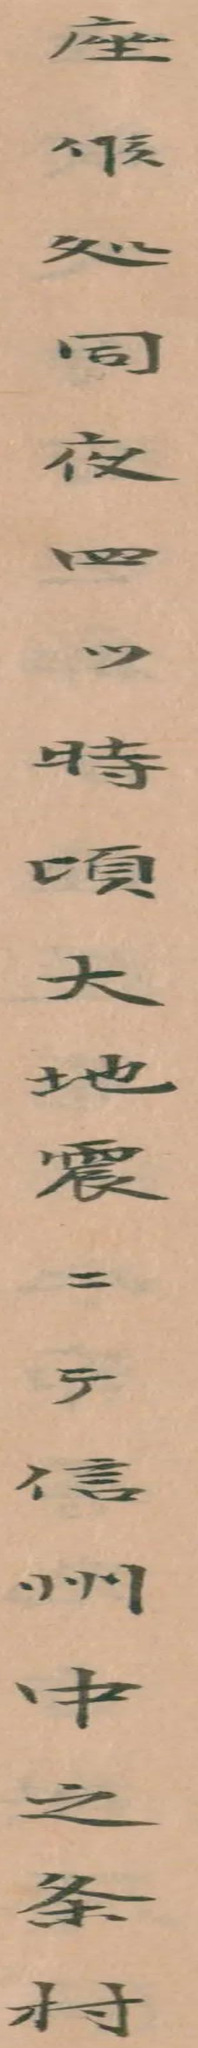座候処同夜四ツ時頃大地震ニテ信州中之条村
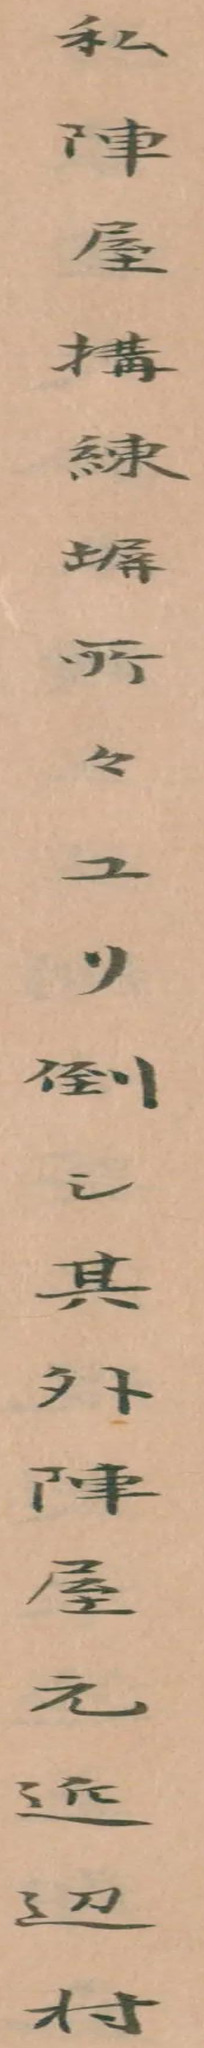私陣屋構練塀所々ユリ倒シ其外陣屋元近辺村
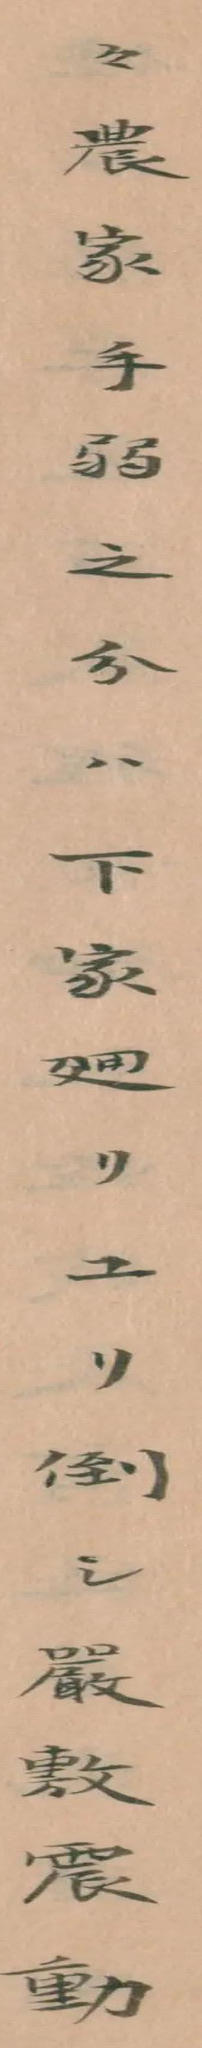々農家手弱之分ハ下家廻りユリ倒シ夥敷震動
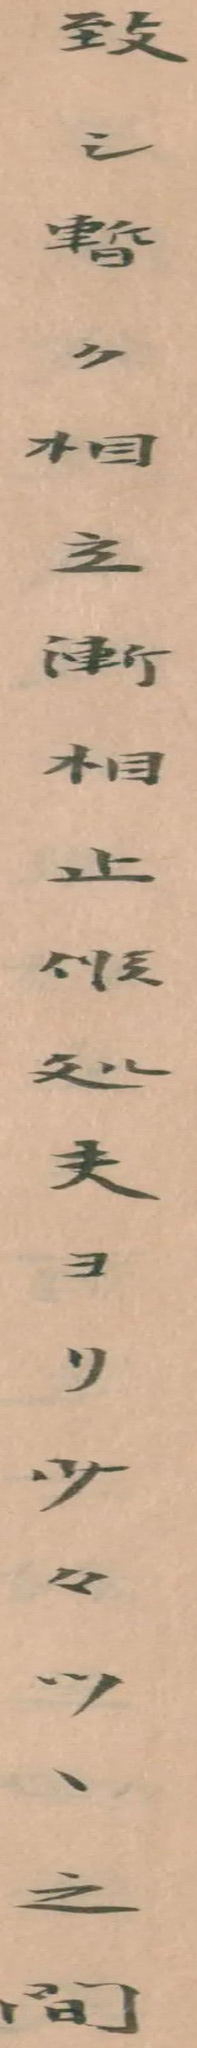致シ暫ク相立漸相止候処夫ヨリ少々ツゞ之間
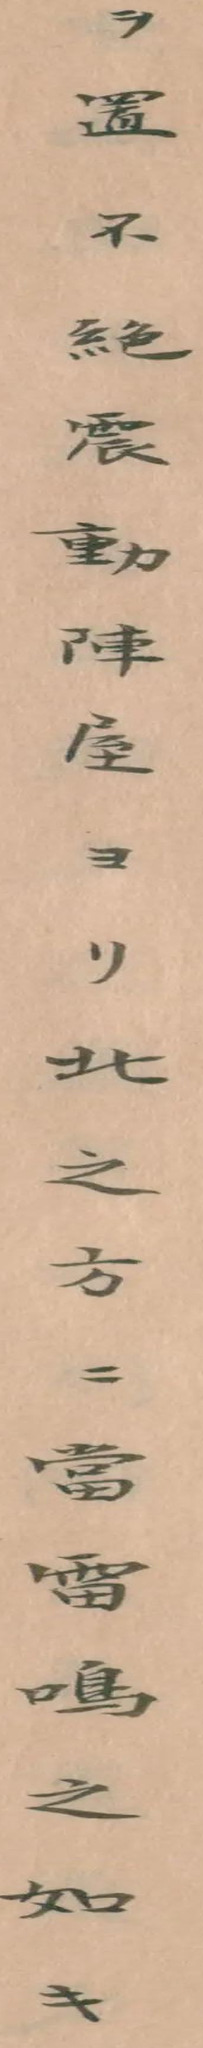ヲ置不絶震動陣屋ヨリ北之方ニ当雷鳴之如キ
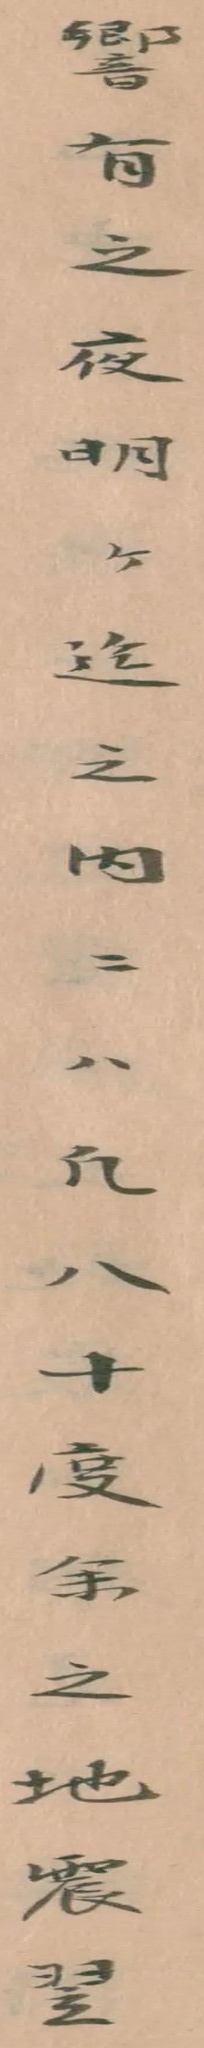響有之夜明ヶ迄之内ニハ凡八十度余之地震翌
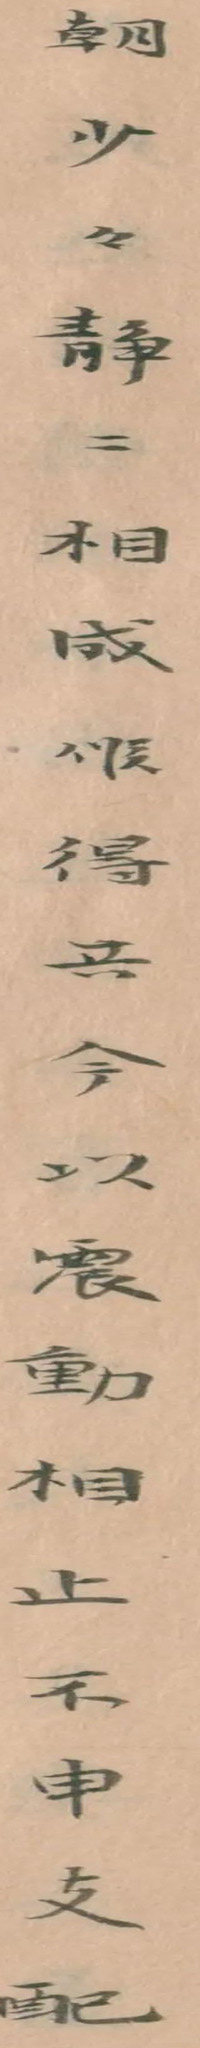朝少々静ニ相成候得共今以震動相止不申支配
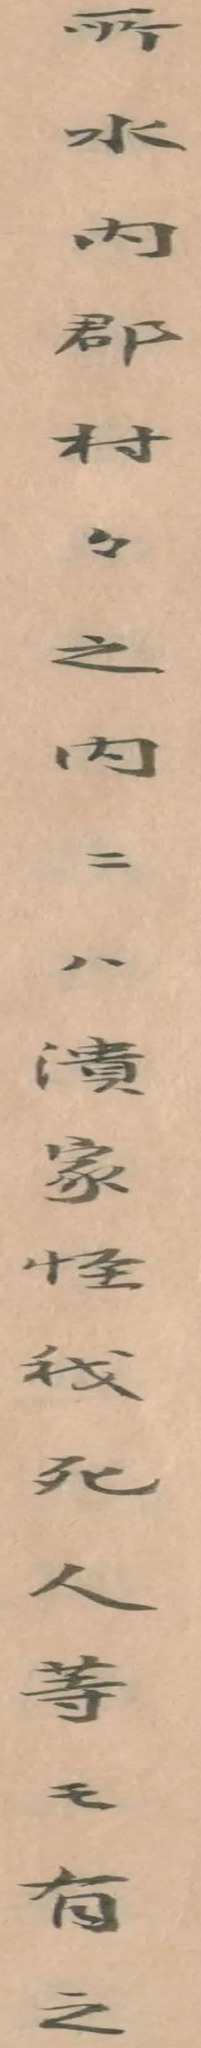所水内郡村々之内二ハ潰家怪我死人等モ有之

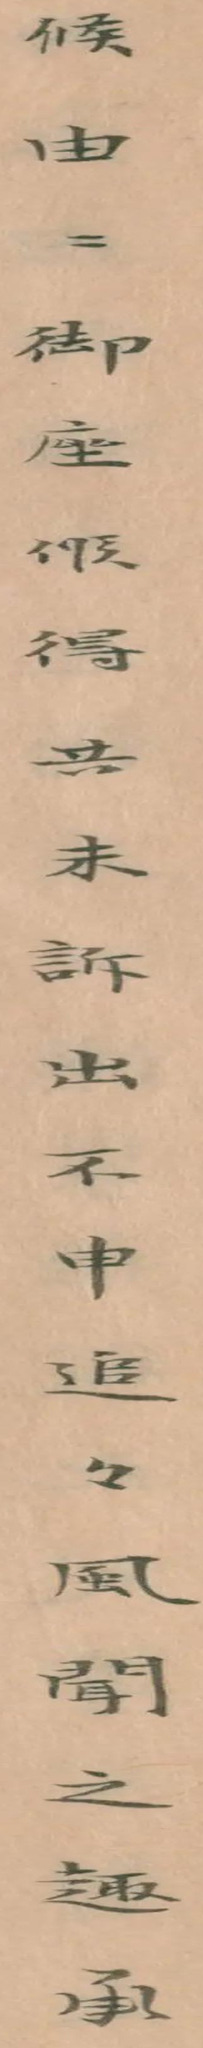候由二御座候得共未訴出不申追々風聞之趣承
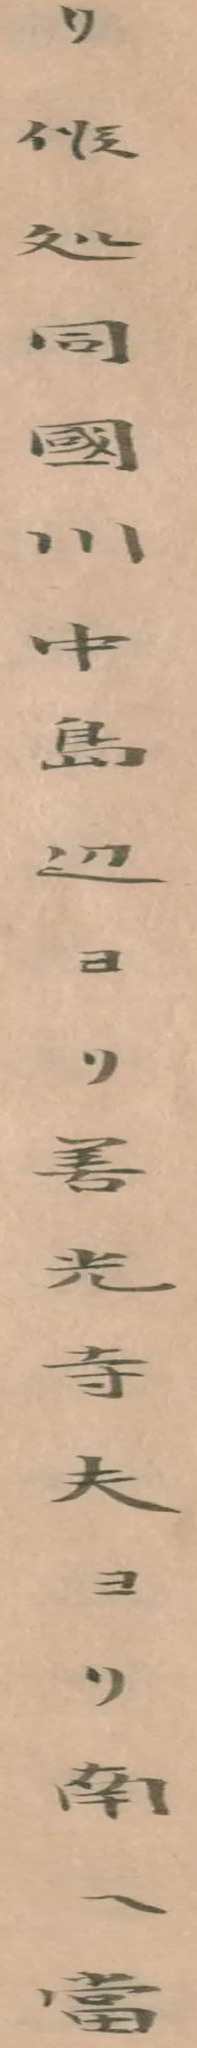り候処同国川中島辺ヨリ善光寺夫ヨリ南へ当
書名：地災撮要. 巻1(噴火山・地震ノ部)
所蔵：国立国会図書館 National Diet Library, JAPAN
